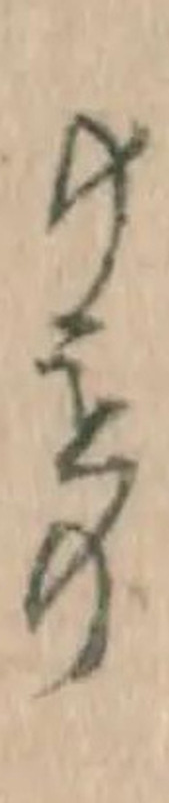のもの
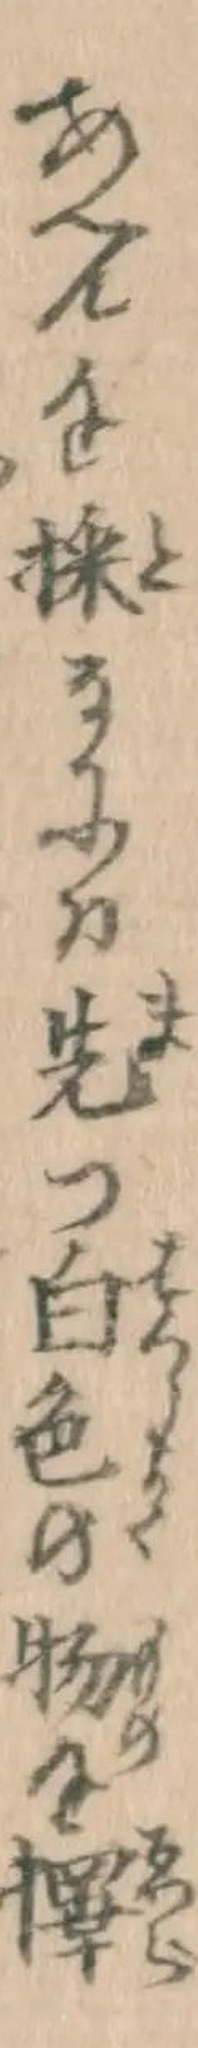あへんを採るには先つ白色の物を択
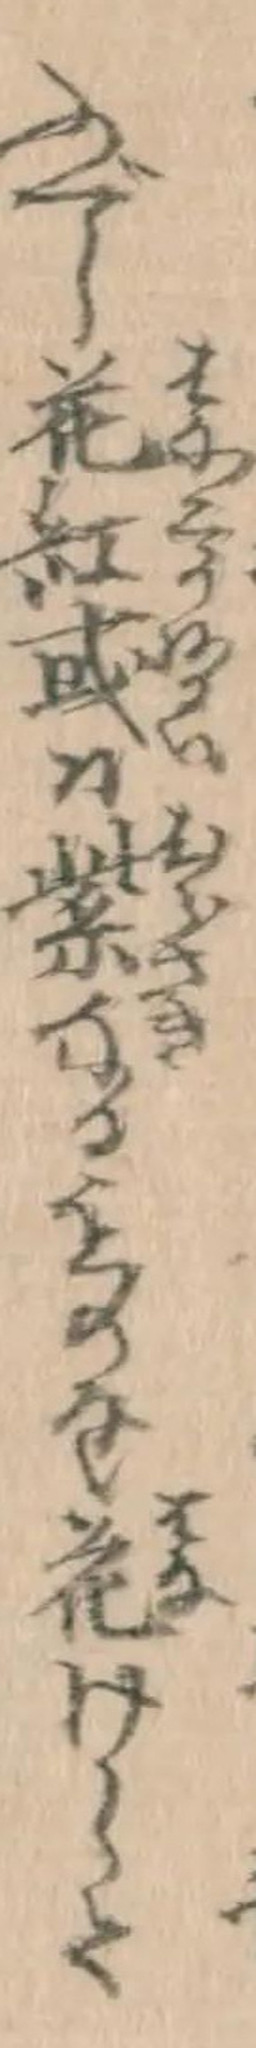ふべし花紅或は紫なるものを花けしと
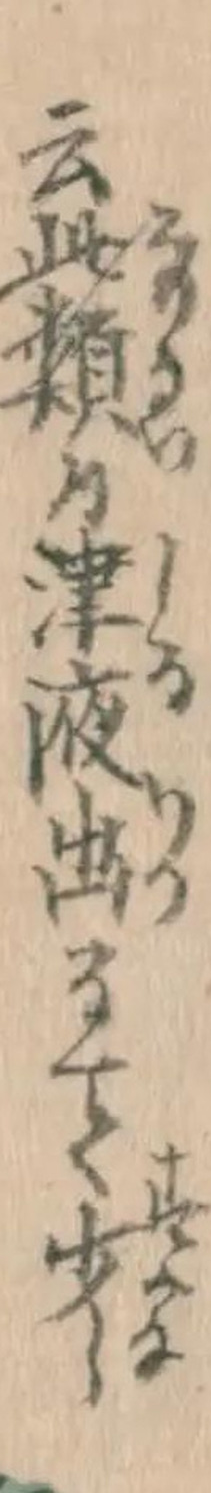云此類は津液出ること少し
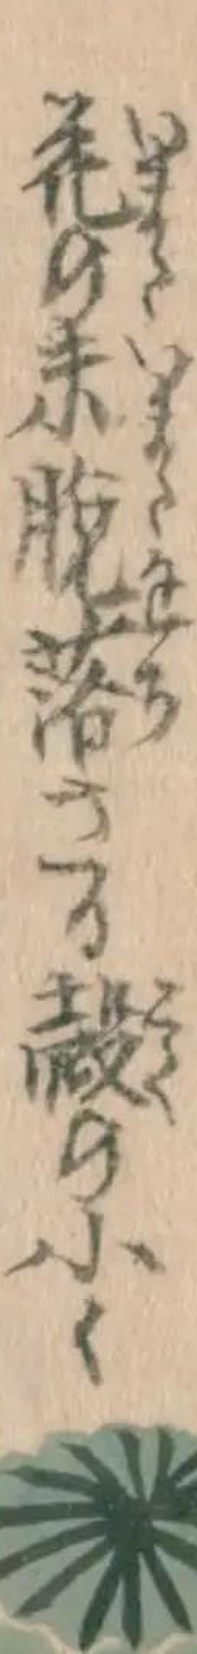花の未脱落さる殻の小く
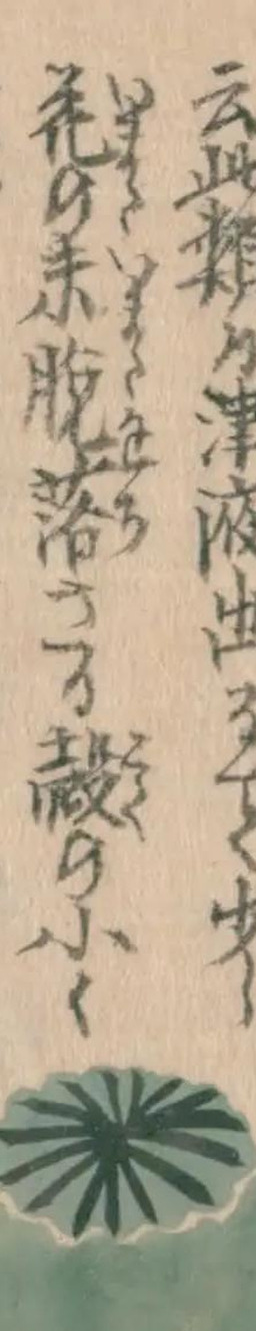花の未脱落さる殻の小く
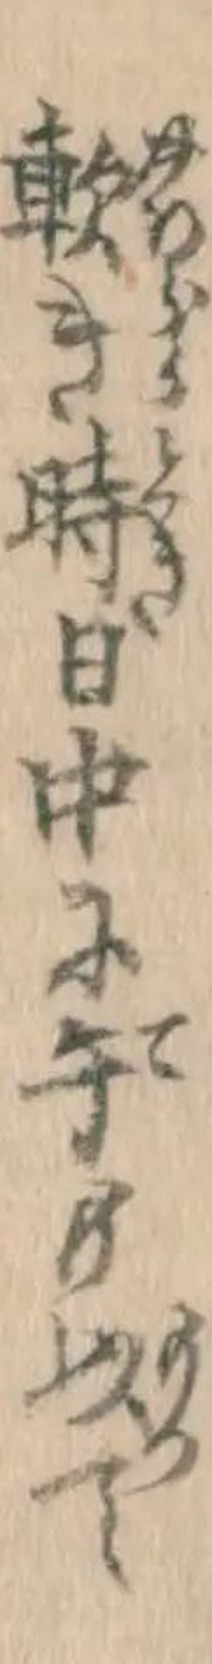軟き時日中に手も以て
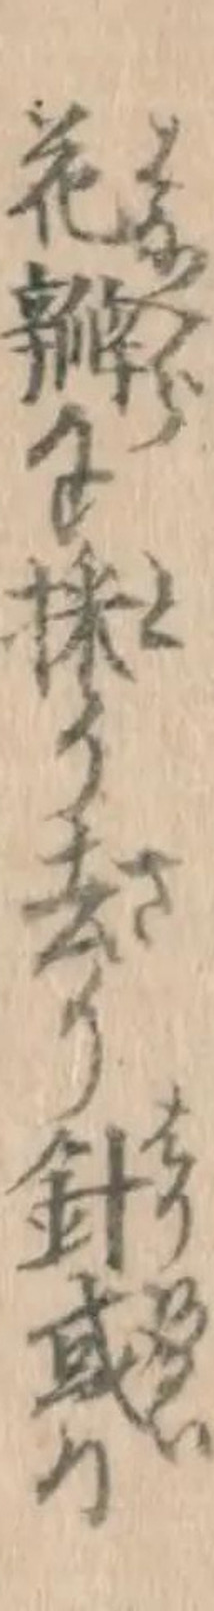花弁を採り去り針或は
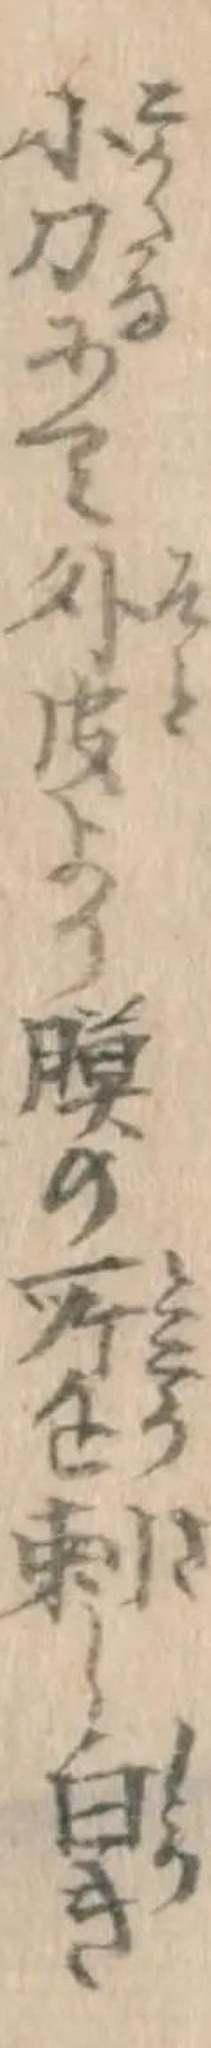小刀にて外皮より膜の所を剌し白き
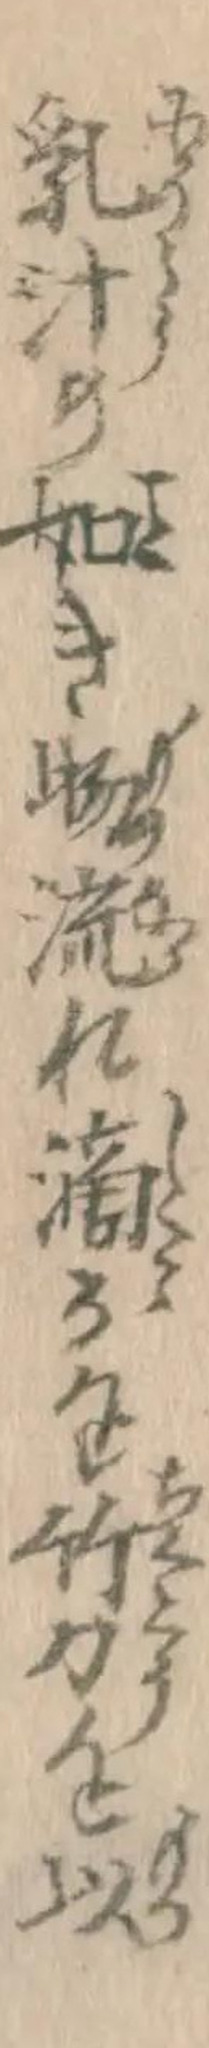乳汁の如き物流れ滴るを竹刀を以
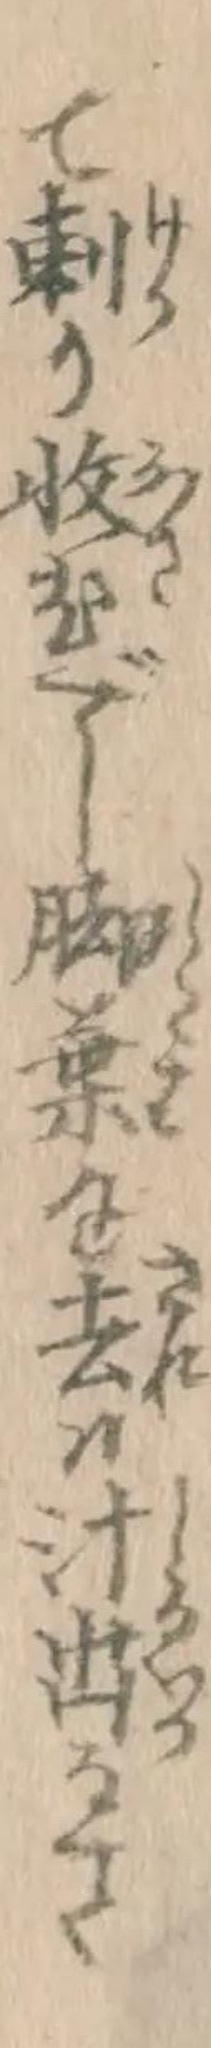てり収むべし脚葉を去は汁出ること
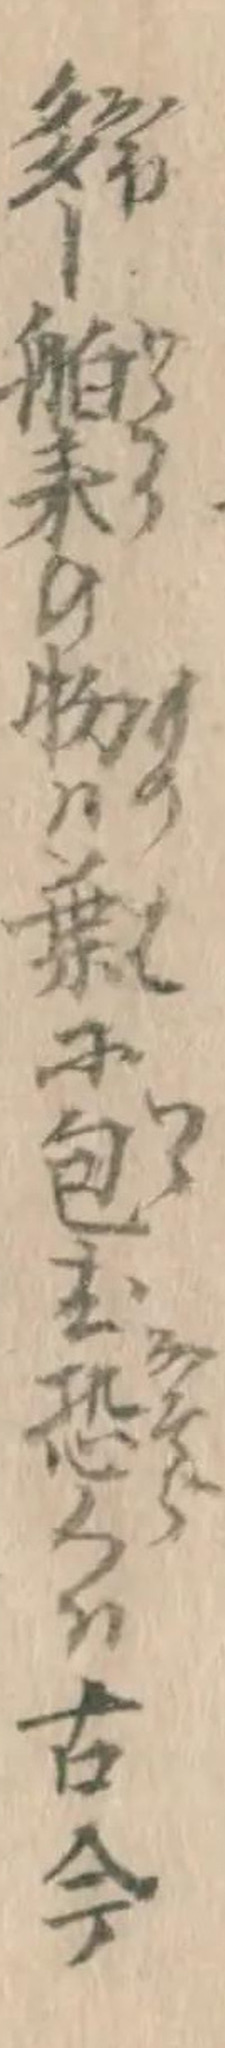多し舶来の物は葉に包む恐くは古今
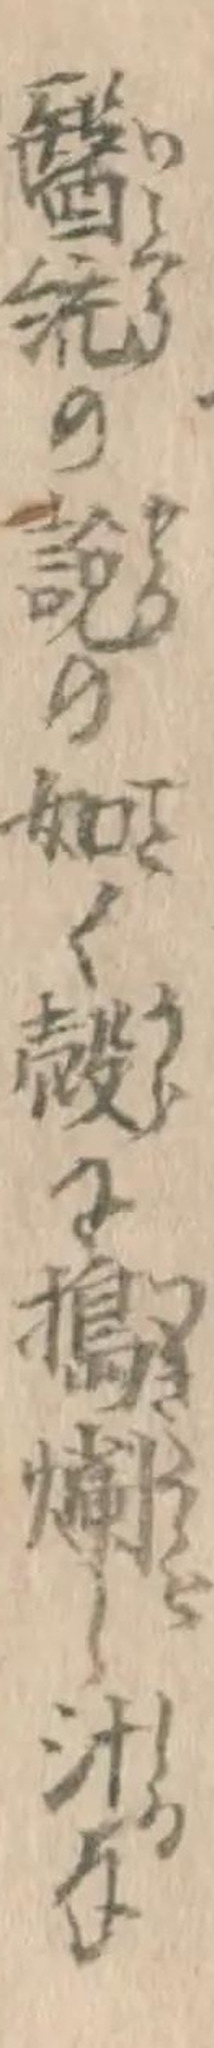医統の説の如く殻を搗爛し汁を
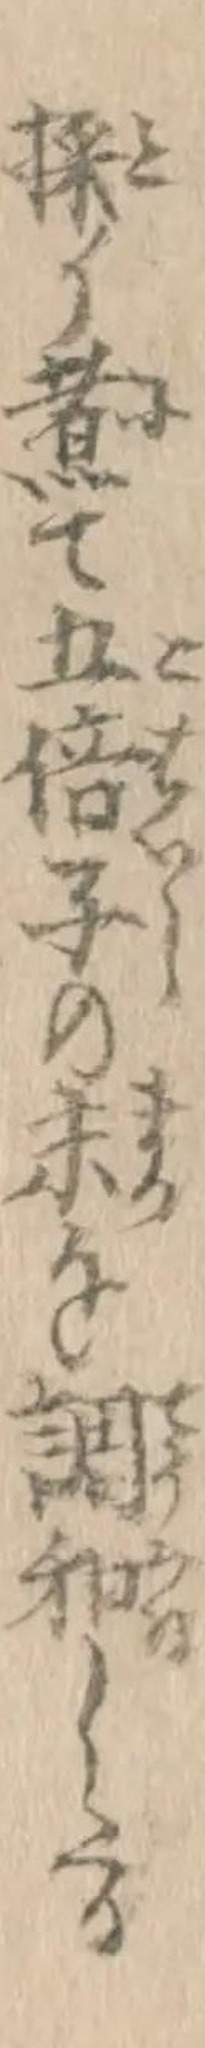採り煮て五倍子の末を調和したる
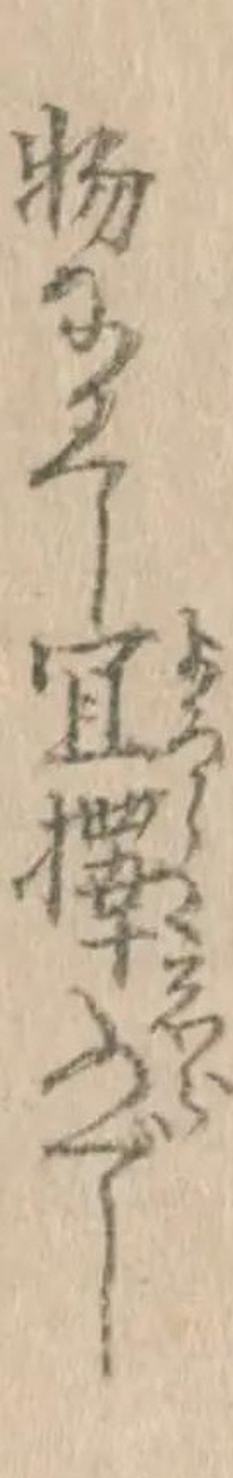物なるへし宜択ふべし

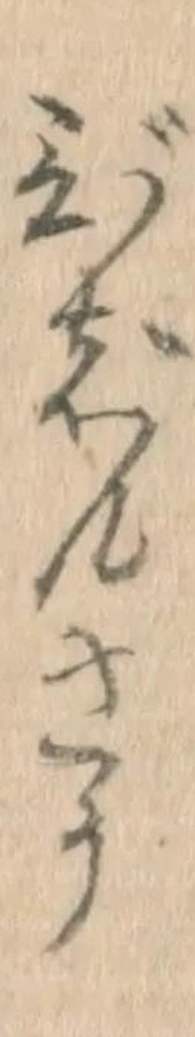びじんさう
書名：本草図譜. 巻40-42
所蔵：国立国会図書館 National Diet Library, JAPAN
